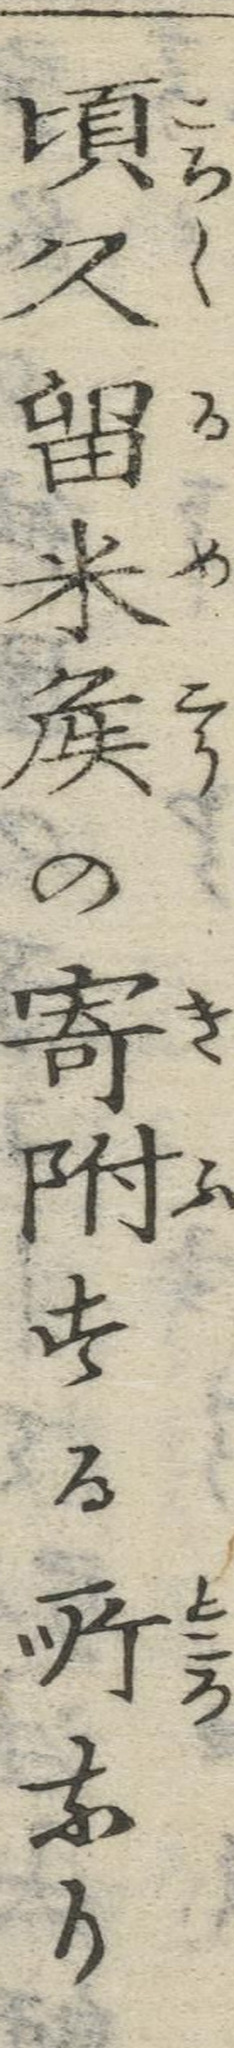頃久留米侯の寄附する所なり
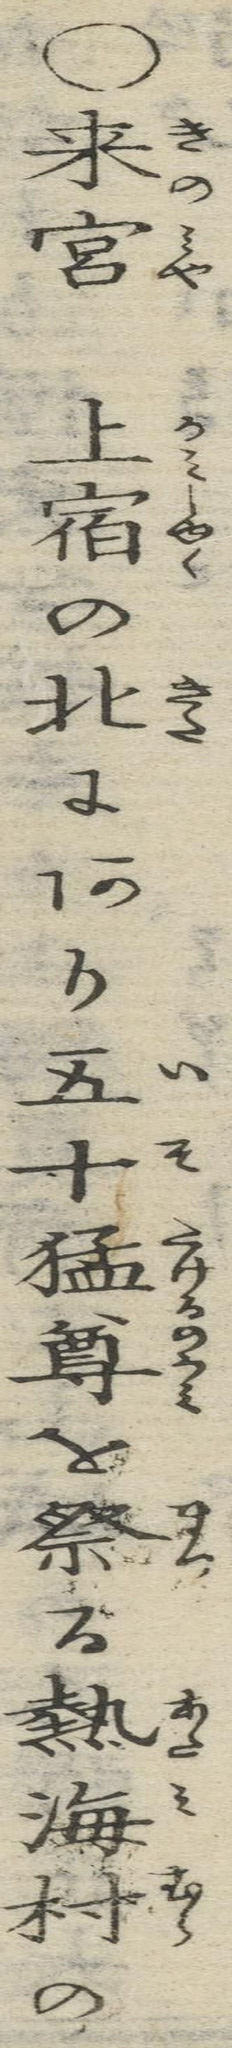○来宮上宿の北にあり五十猛尊を祭る熱海村の
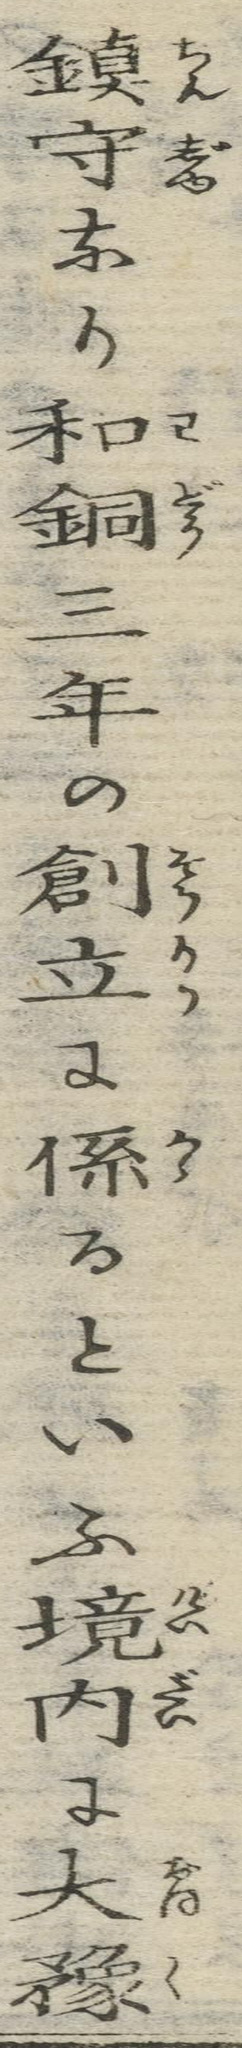鎮守なり和銅三年の創立に係るといふ境内に大豫
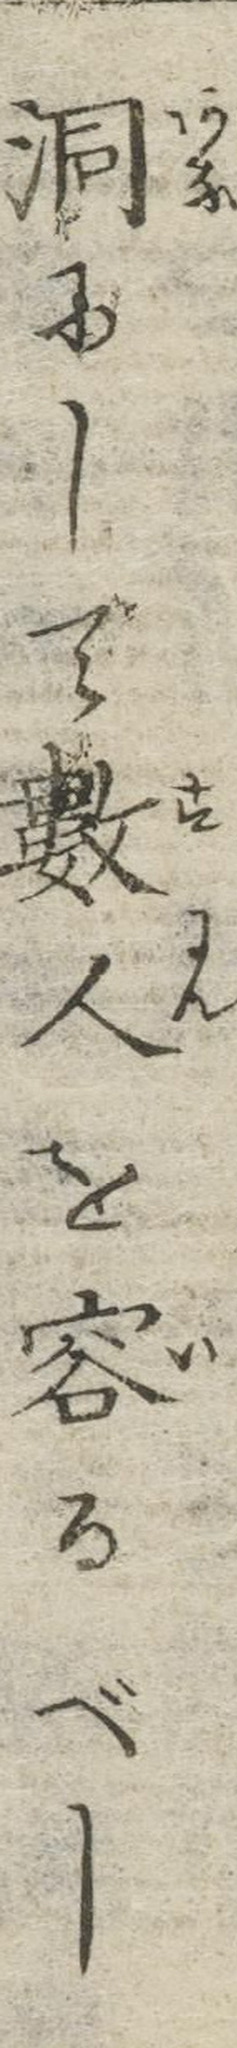洞にして数人を容るべし
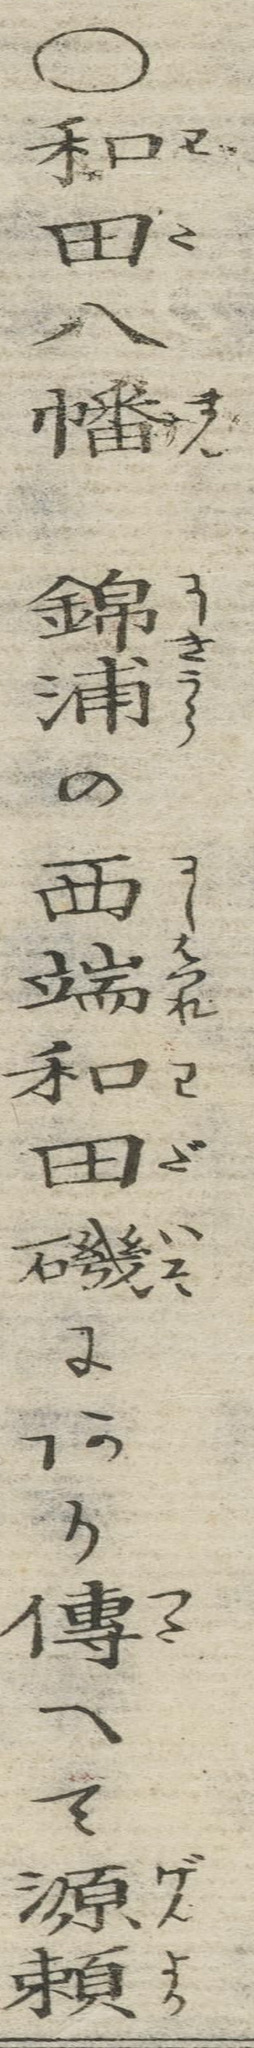○和田八幡錦浦西端和田磯にあり伝へて源頼
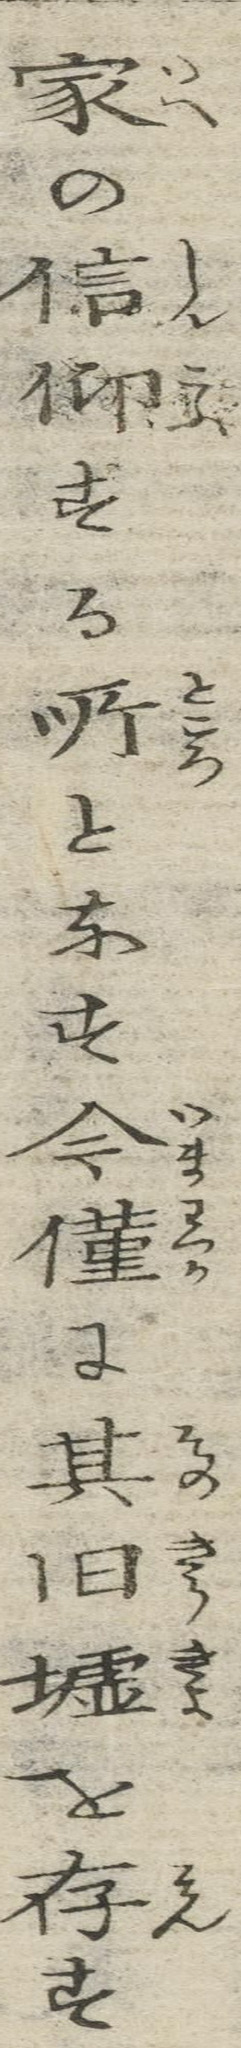家の信仰する所となす今僅に其旧墟を存す
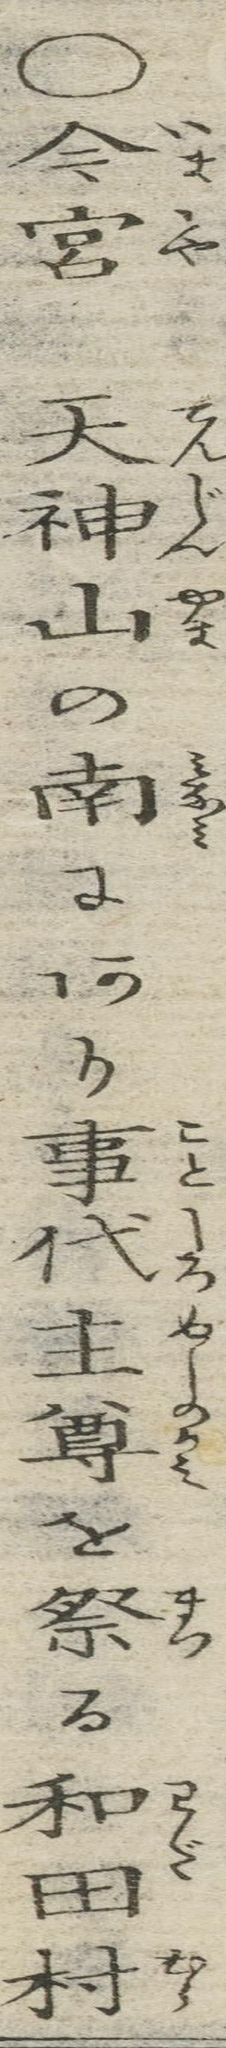○今宮天神山の南にあり事代主尊を祭る和田村
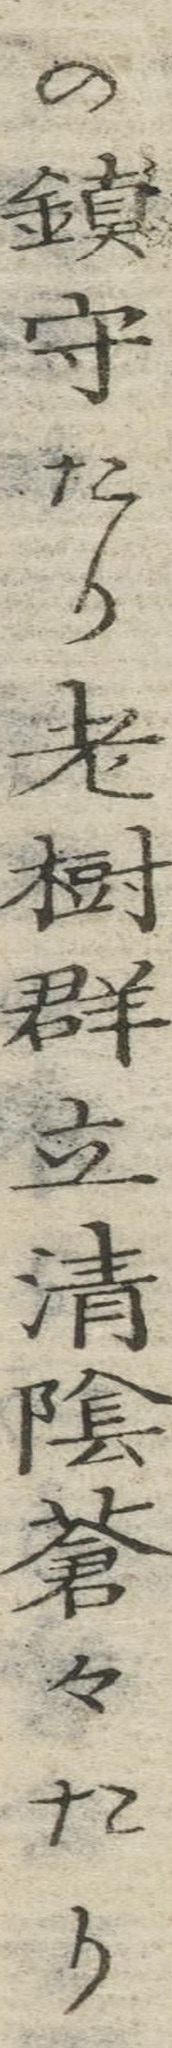の鎮守たり老樹群立清陰蒼々たり

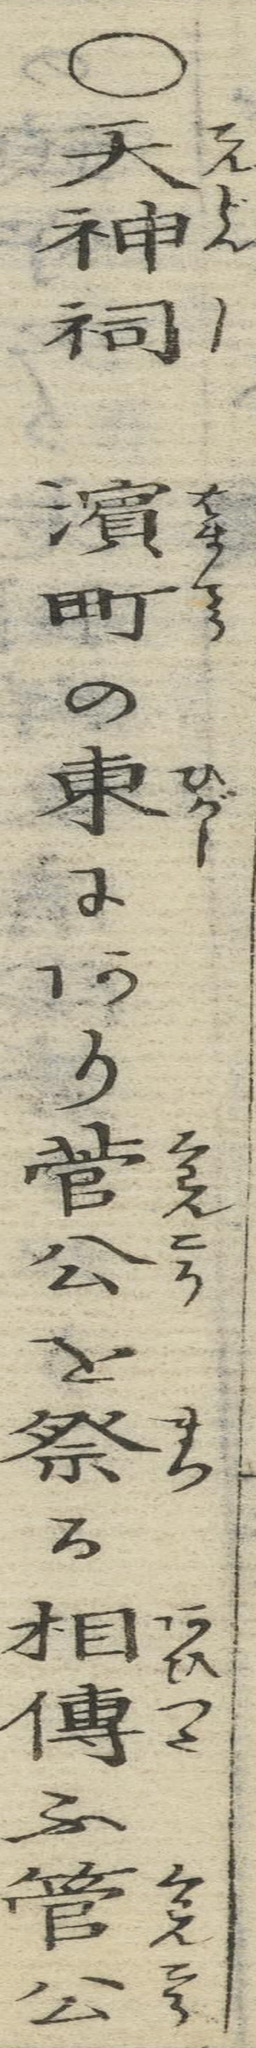○天神祠浜町の東にあり菅公を祭る相伝ふ菅公
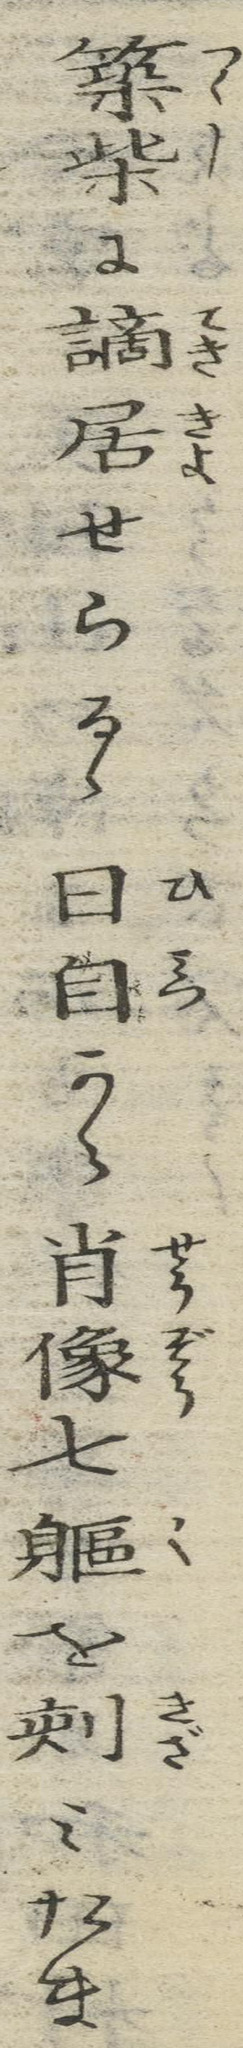築柴に謫居せらるゝ日自から肖像七躯を刻みたま
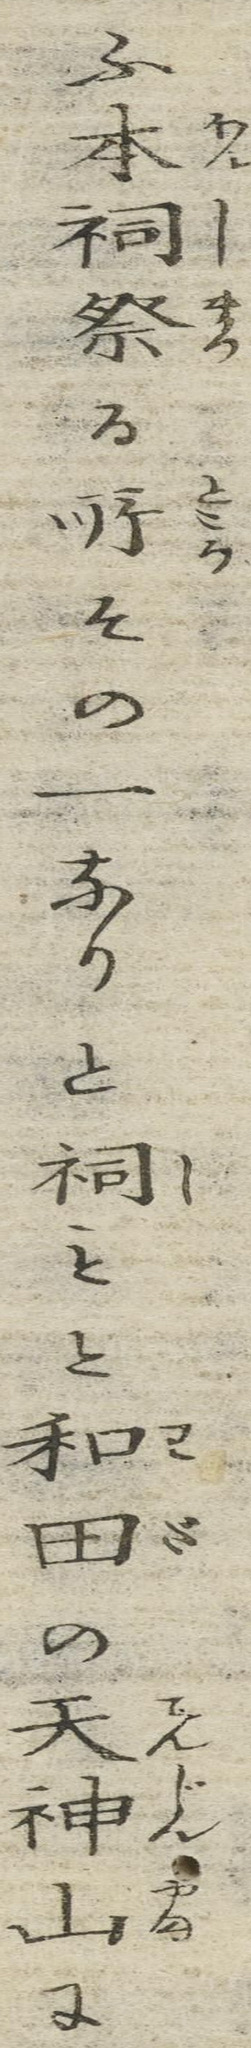ふ本祠祭る所その一なりと祠もと和田の天神山に
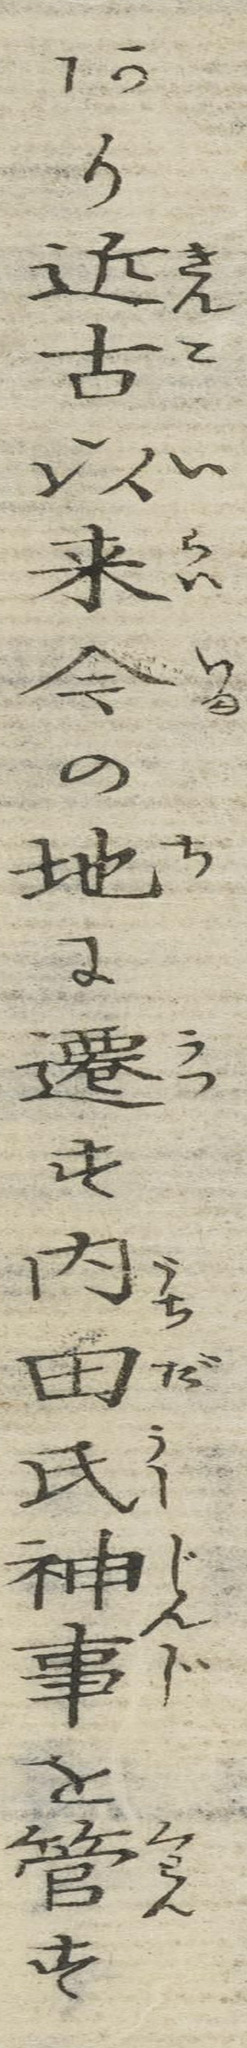あり近古以来今の地に遷す内田氏神事を管す
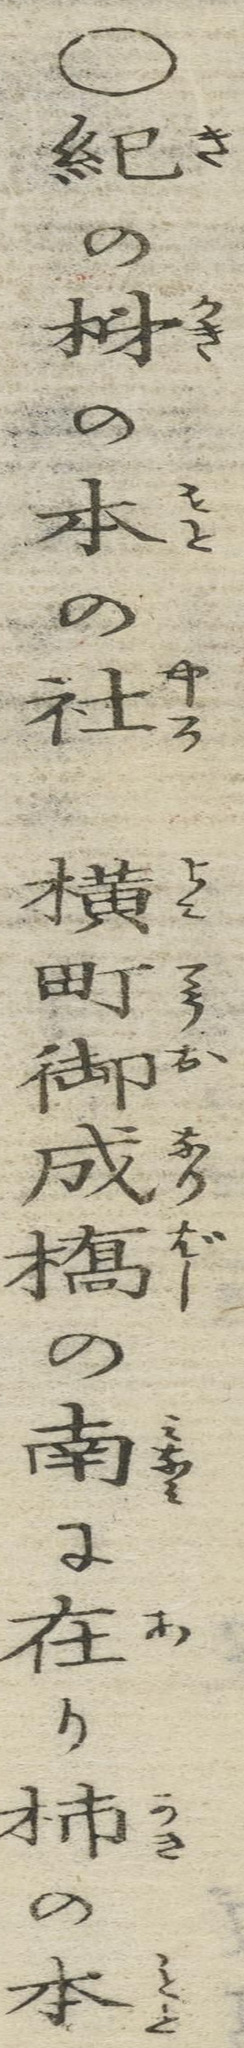○紀の柿の本の社横町御成橋の南に在り柿の本
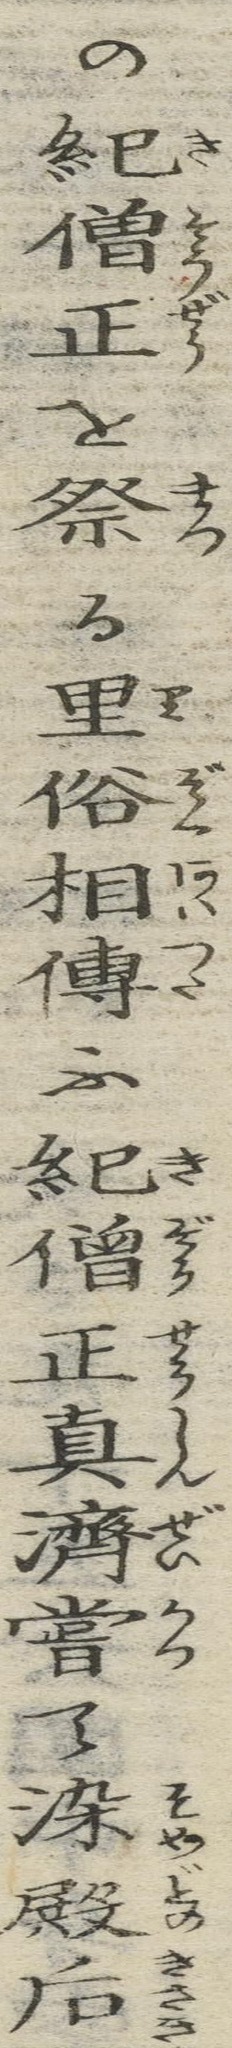の紀僧正を祭る里俗相伝ふ紀僧正真済嘗て染殿后
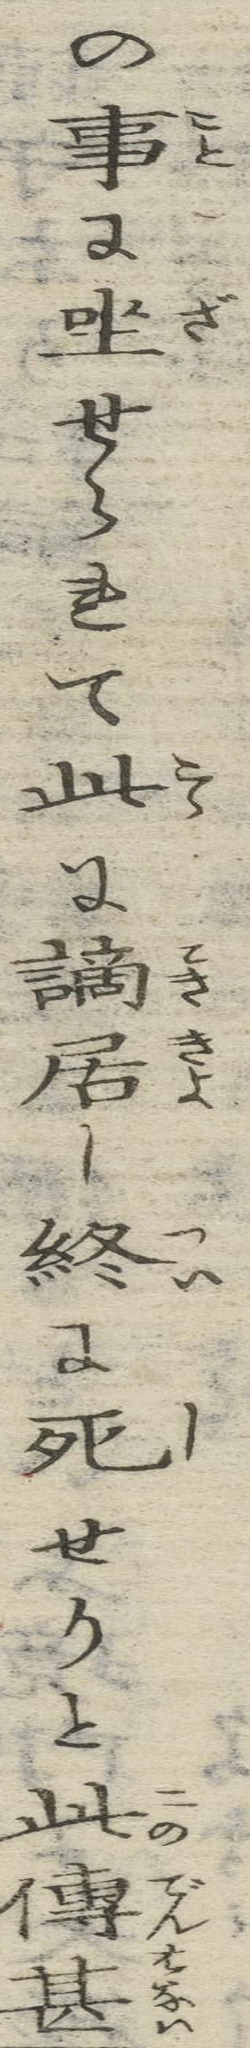の事に坐せられて此に謫居し終に死せりと此伝甚
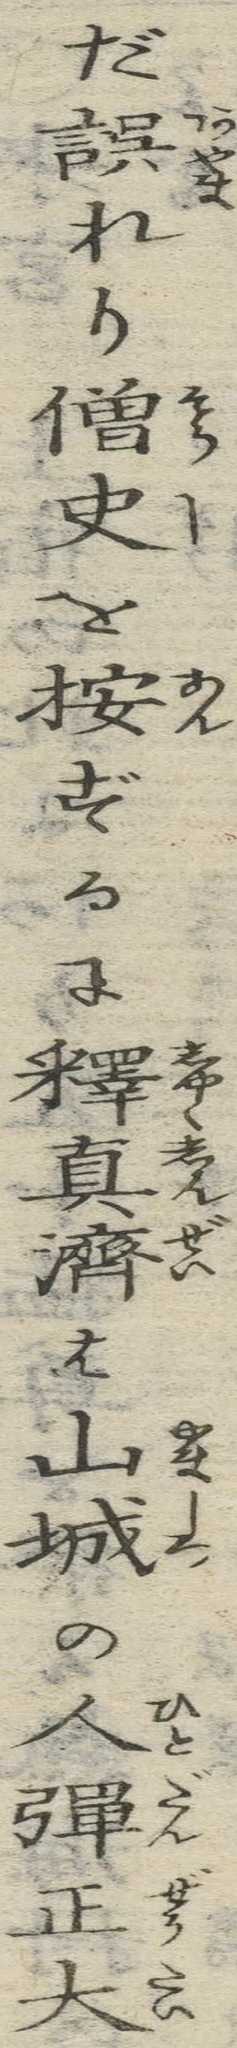だ誤れり僧史を按ずるに釈真済は山城の人弾正大
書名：豆州熱海誌　完
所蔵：東京大学地震研究所図書室 Earthquake Research Institute Library, The University of Tokyo, JAPAN
